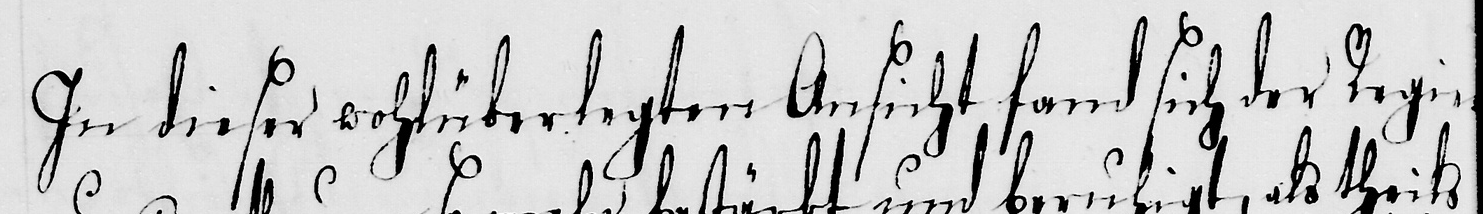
In dieser wohlüberlegten Ansicht fand sich der Regi¬
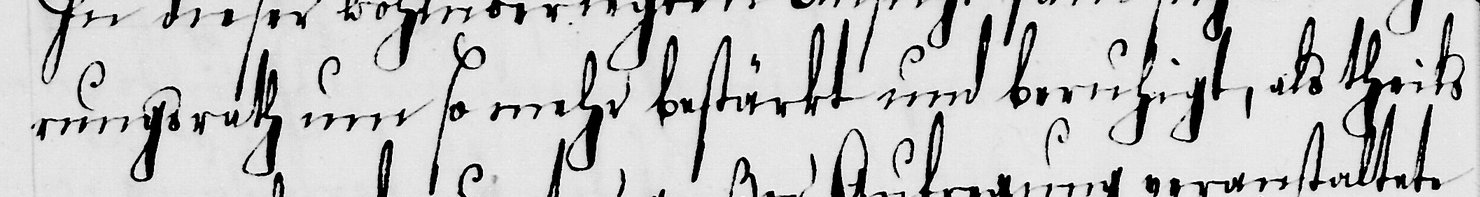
erungsrath um so mehr bestärkt und beruhigt, als theils
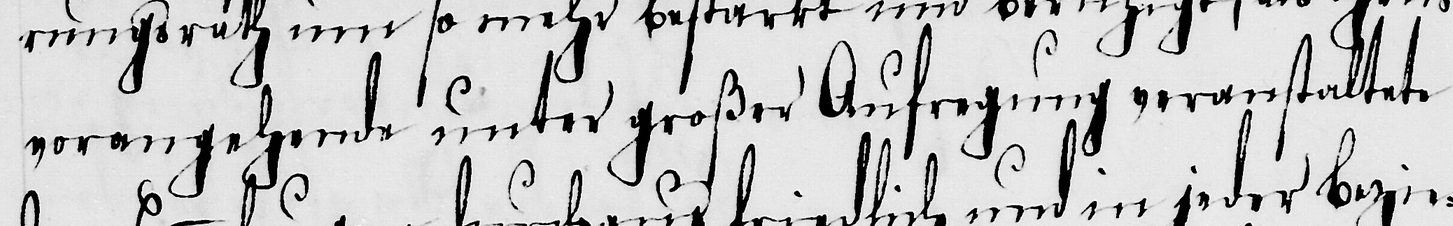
vorangehende unter großer Aufregung veranstaltete
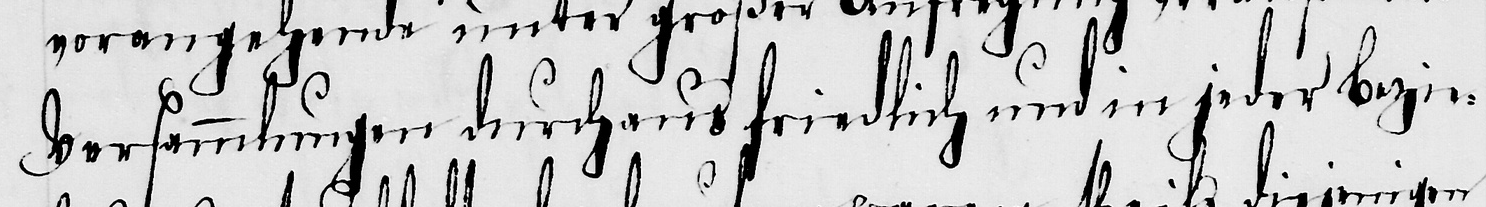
Versammlungen durchaus friedlich und in jeder Bezie¬
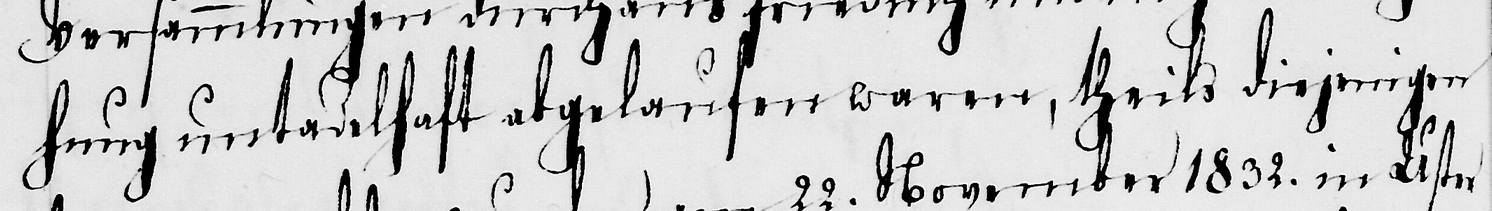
hung untadelhaft abgelaufen waren, theils diejenigen
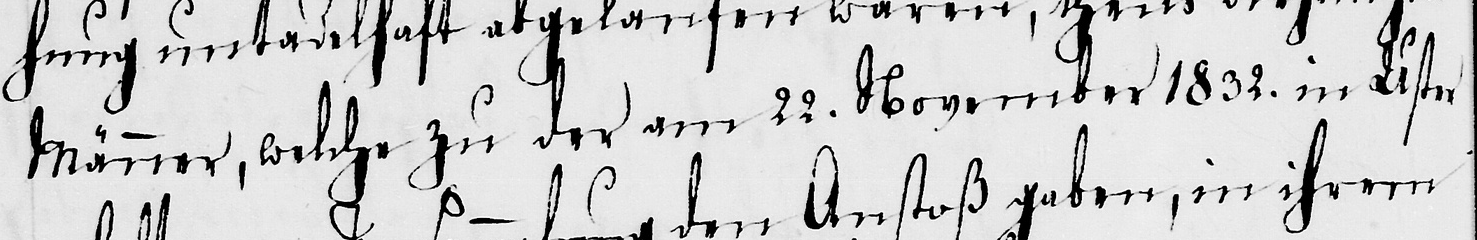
Männer, welche zu der am 22. November 1832. in Uster
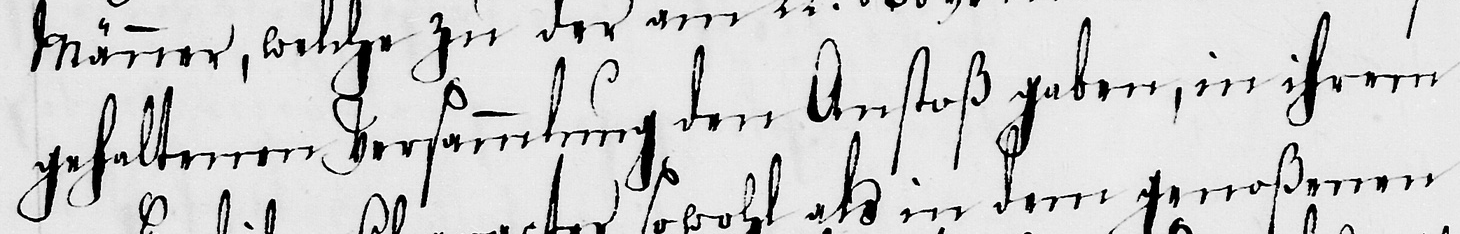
gehaltenen Versammlung den Anstoß gaben, in ihrem
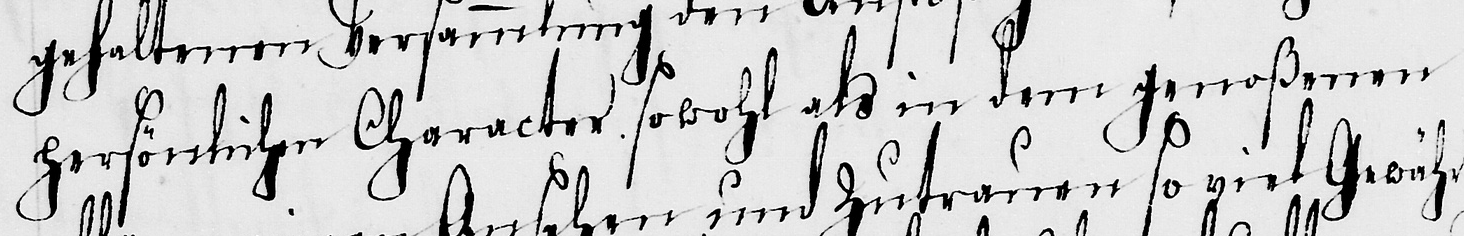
persönlichen Character sowohl als in dem genoßenen
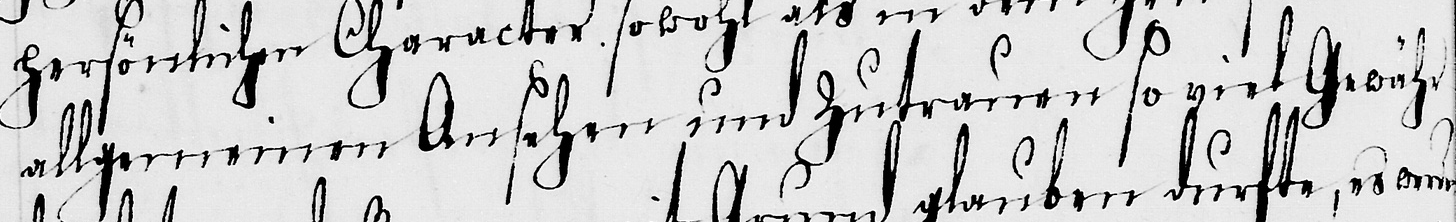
allgemeinen Ansehen und Zutrauen so viel Gewähr
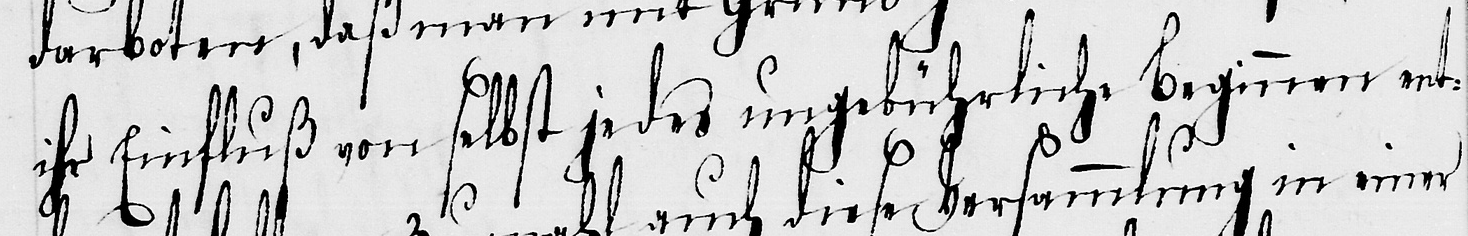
ihr Einfluß von selbst jedes ungebührliche Beginnen en¬
